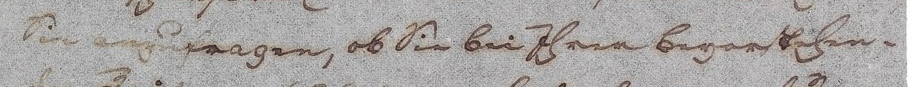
Sie anzufragen, ob Sie bei Ihrer bevorstehen-
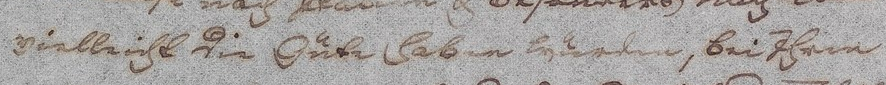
vielleicht die Güte haben würden, bei Ihren
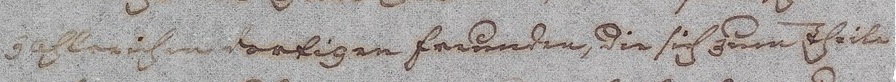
zahlreichen dortigen Freunden, die sich zum Theile
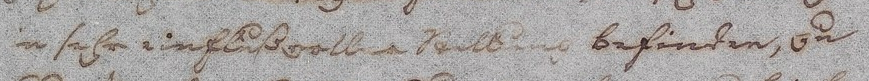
in sehr einflußvoller Stellung befinden, zu
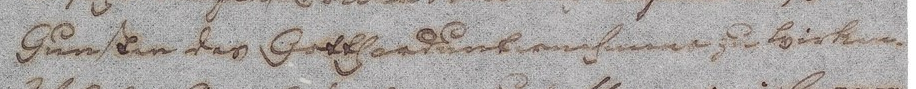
Gunsten des Gotthardunternehmens zu wirken.
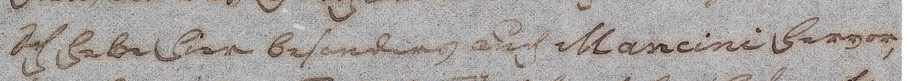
Ich hebe hier besonders auch Mancini hervor,
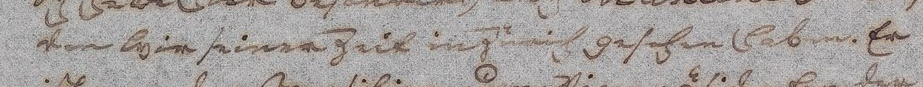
den wir seiner Zeit in Zürich gesehen haben. Er
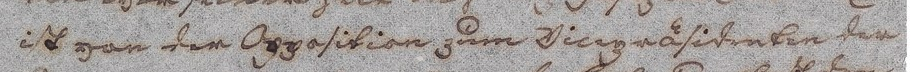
ist von der Opposition zum Vicepräsidenten der
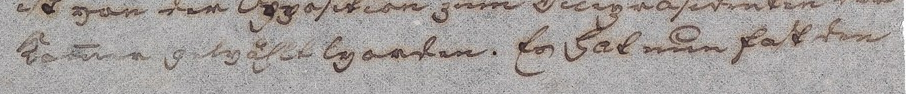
Kammer gewählt worden. Es hat nun fast den
